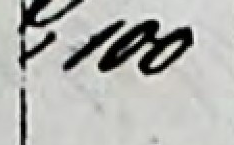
0,100
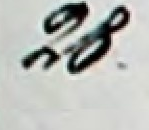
28
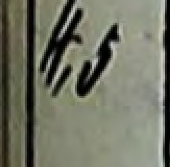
4,5
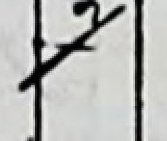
7
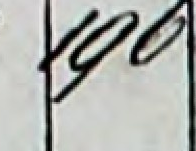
196
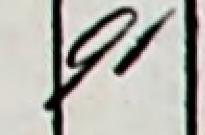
91
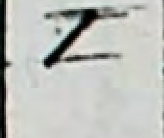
I
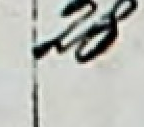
28
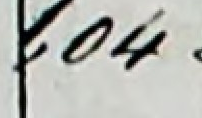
1,04
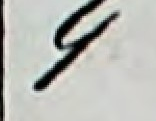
9
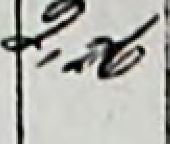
2,26
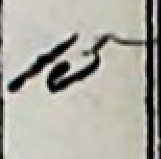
15
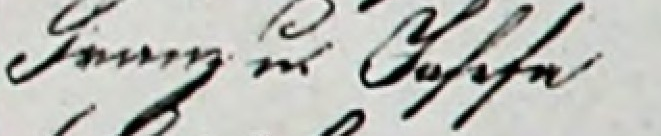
Franz u. Josefa
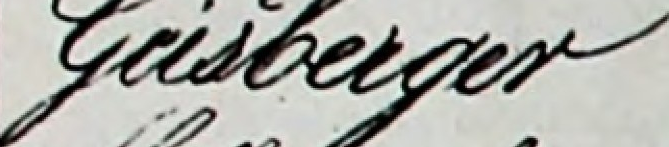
Geisberger
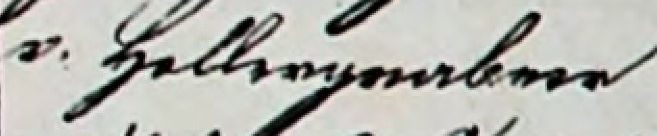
v. Hellergrabner
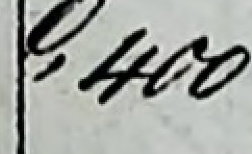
0,400
